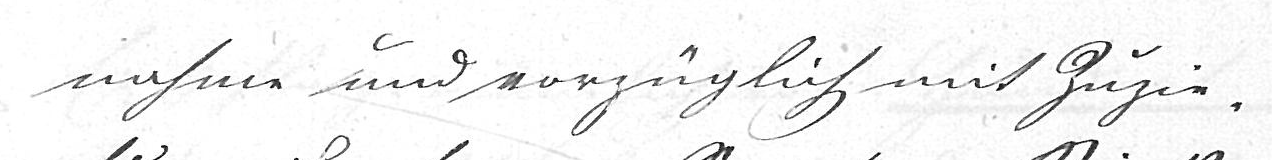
nahme und vorzüglich mit Zuzie-
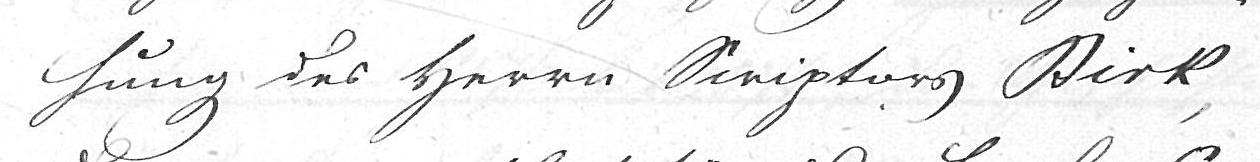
hung des Herrn Scriptors Birk
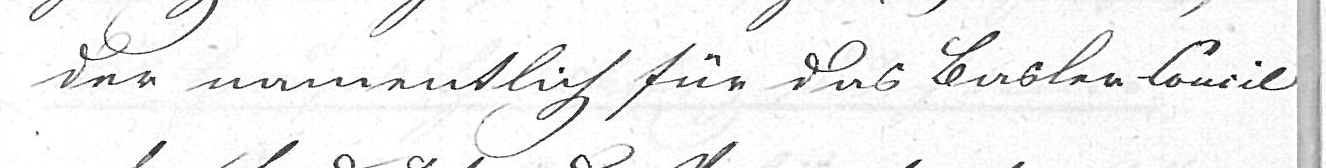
der namentlich für das Basler Concil
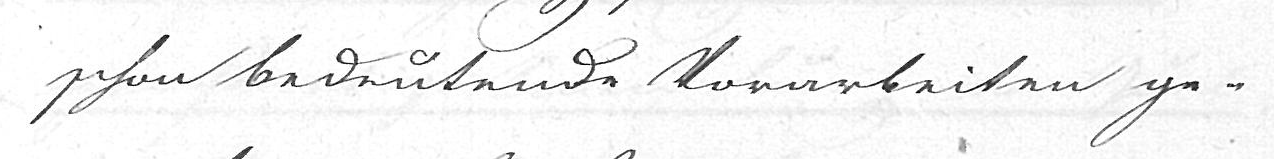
schon bedeutende Vorarbeiten ge-
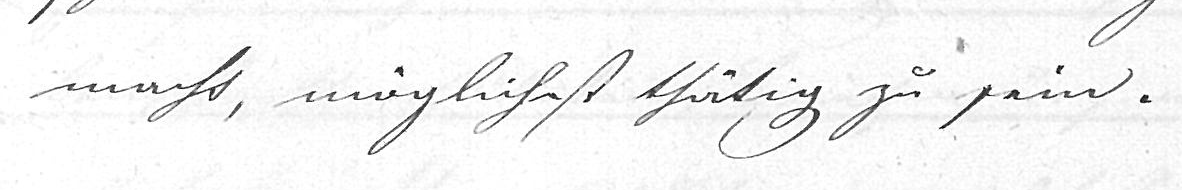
macht, möglichst thätig zu sein.
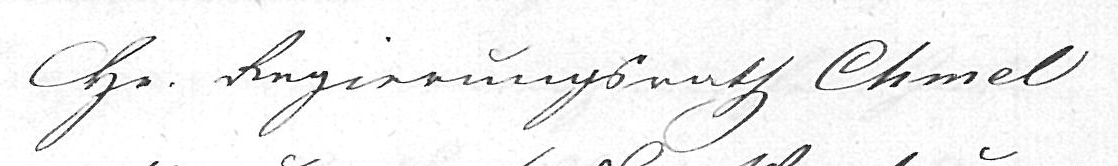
Hr. Regierungsrath Chmel
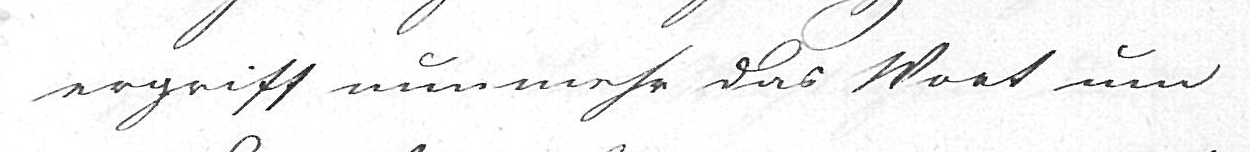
ergriff nunmehr das Wort um
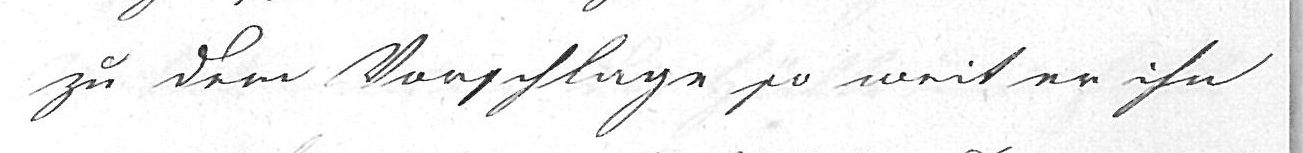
zu dem Vorschlage so weit er ihn
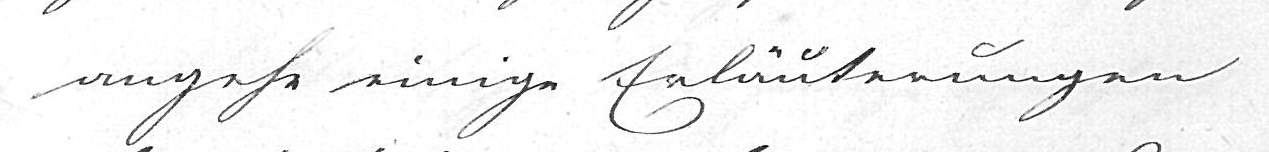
angehe einige Erläuterungen
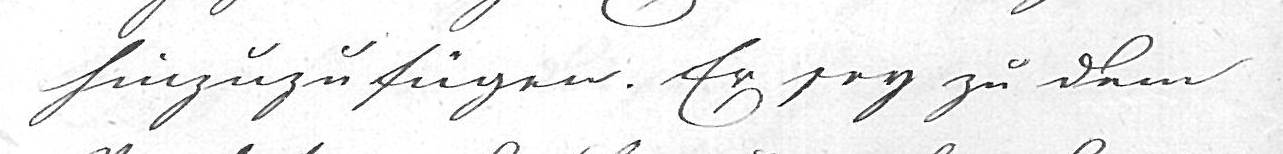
hinzuzufügen. Er sey zu dem
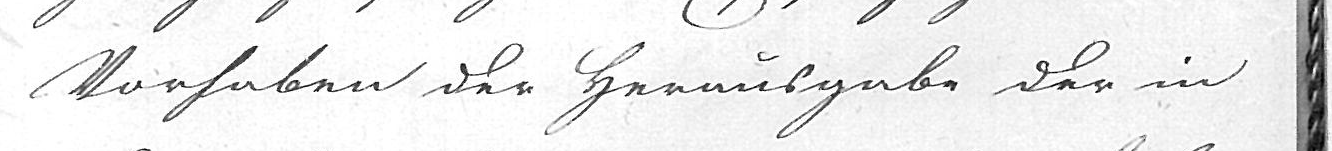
Vorhaben der Herausgabe der in
